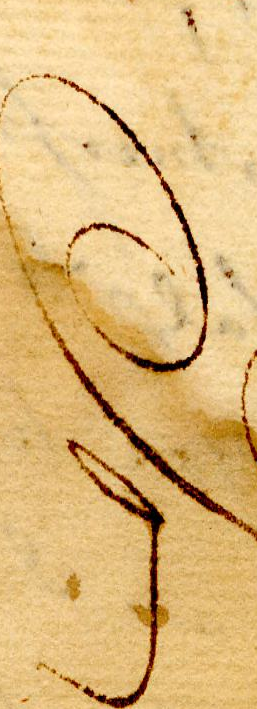To
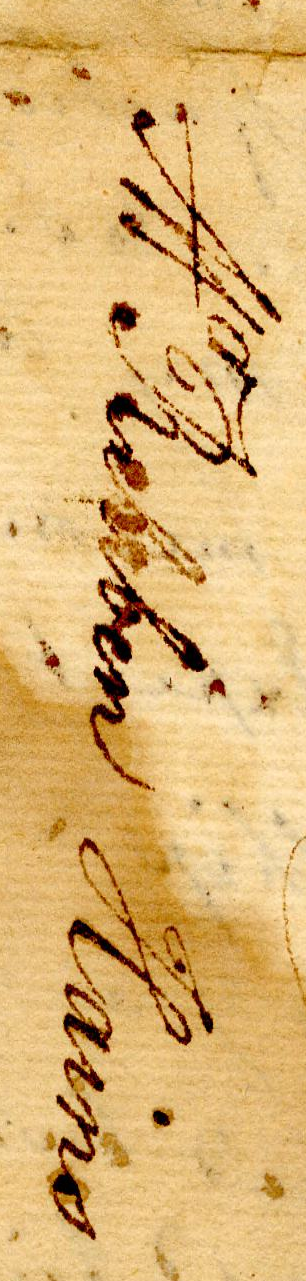M^r Reuben Hains
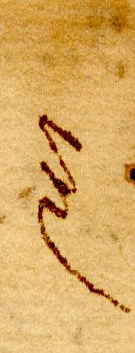in
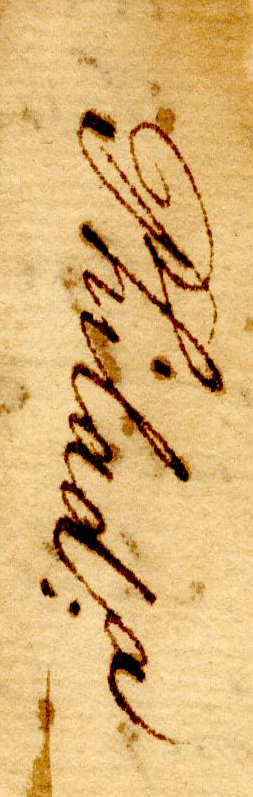Philad:^a
